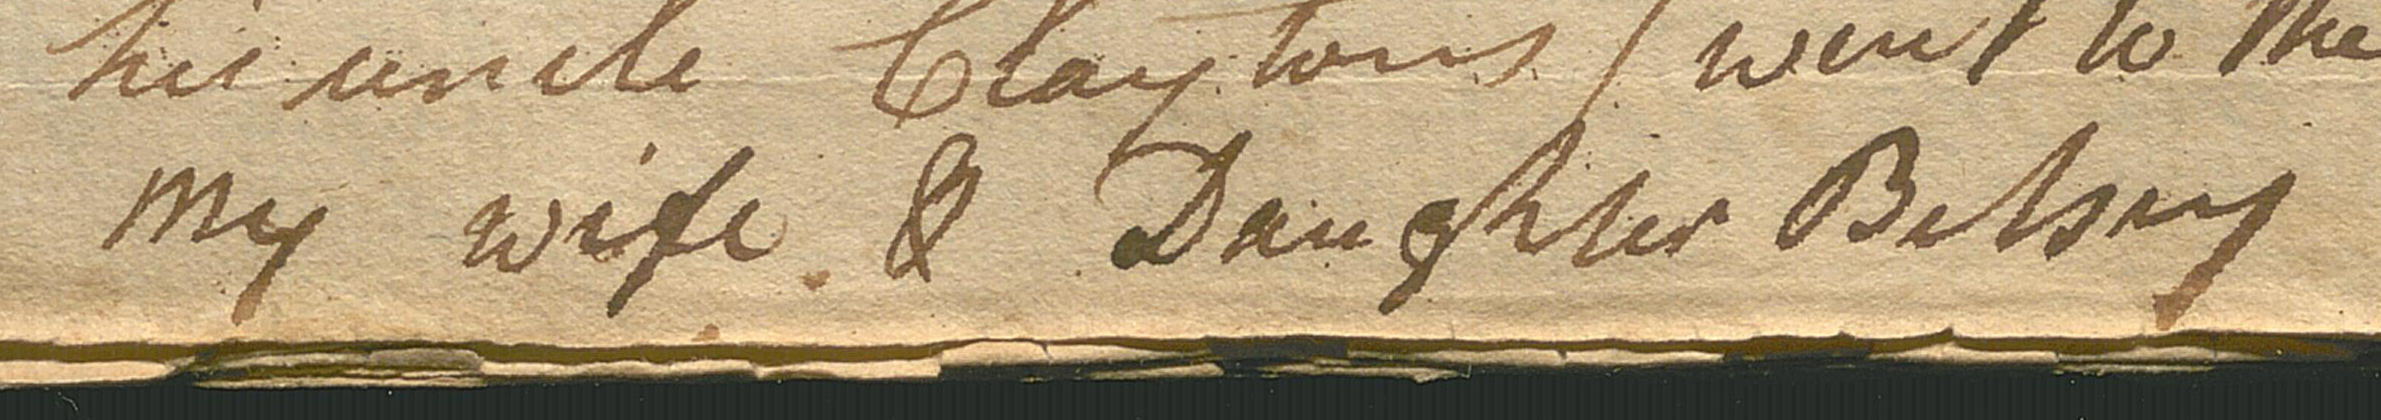my wife & Daughter Betsey
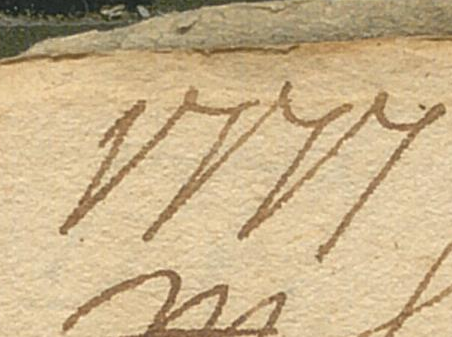1777
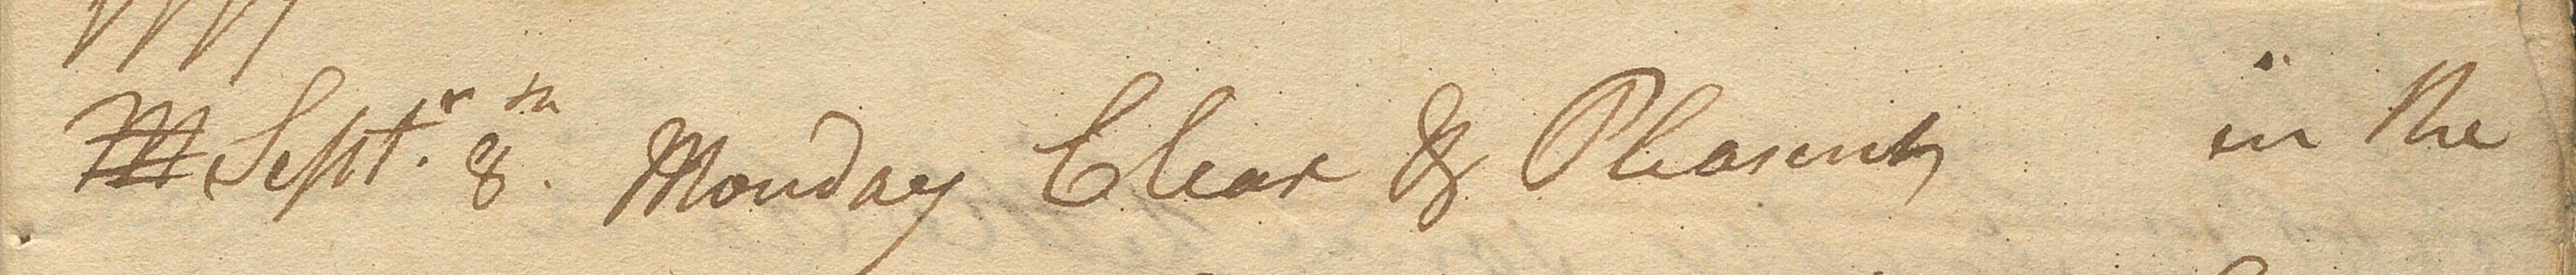[_] Sept^r. 8^th. Monday Clear & Pleasent in the
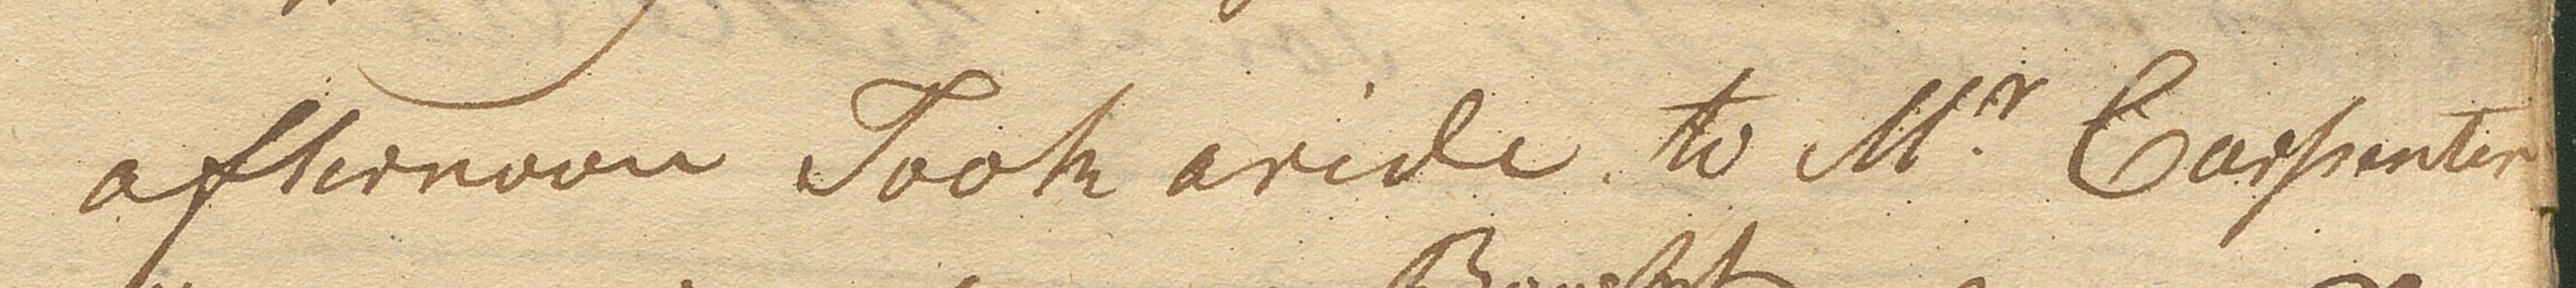afternoon Took a ride to M^r. Carpenter
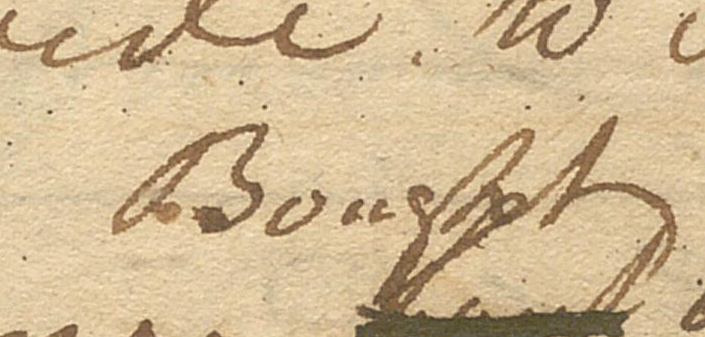Bought
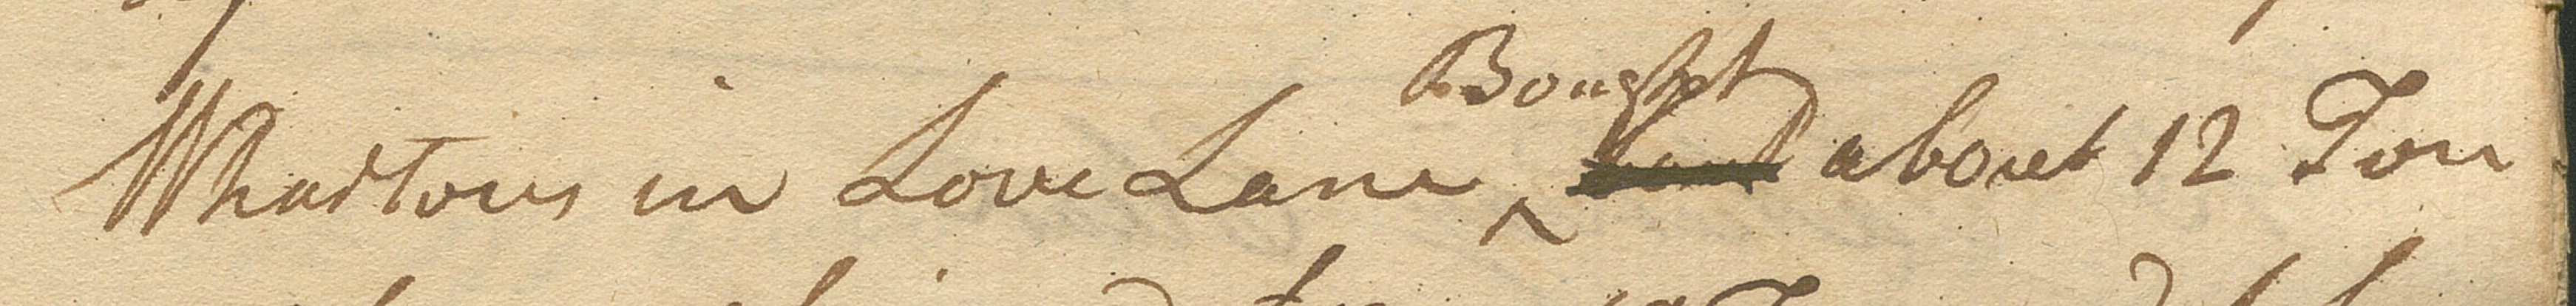Whartons in Love Lane, ^ [____] about 12 Ton
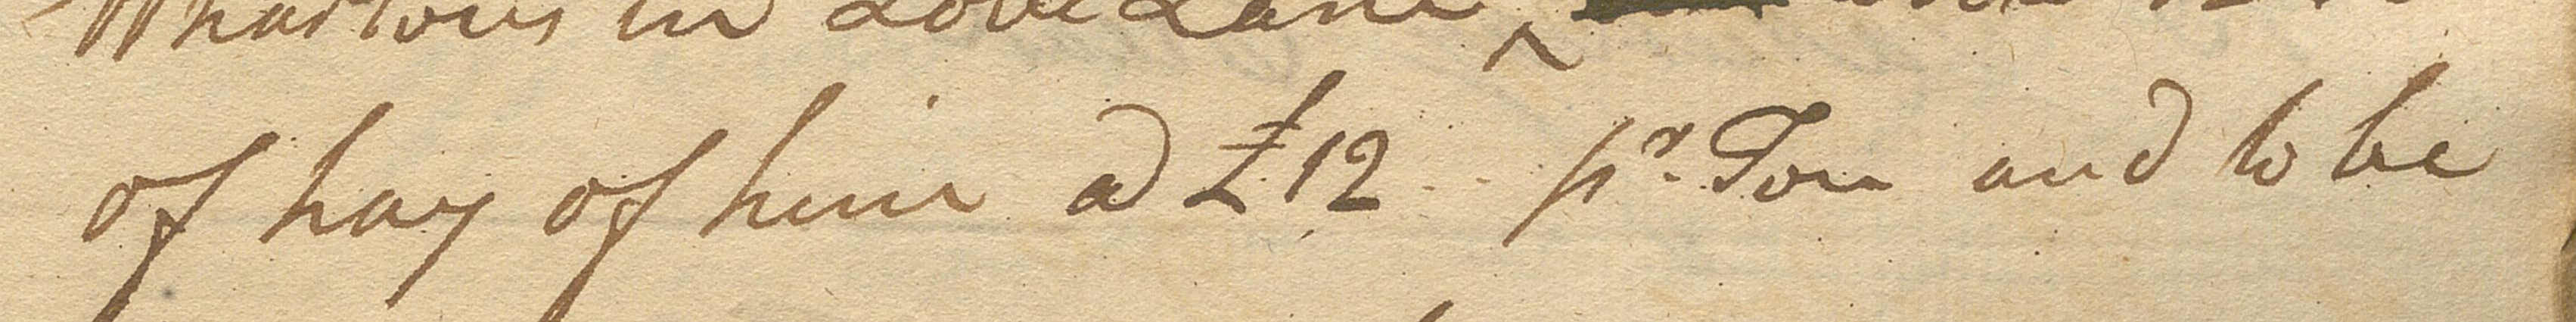of hay of him @ £12 p^r. Ton and to be
